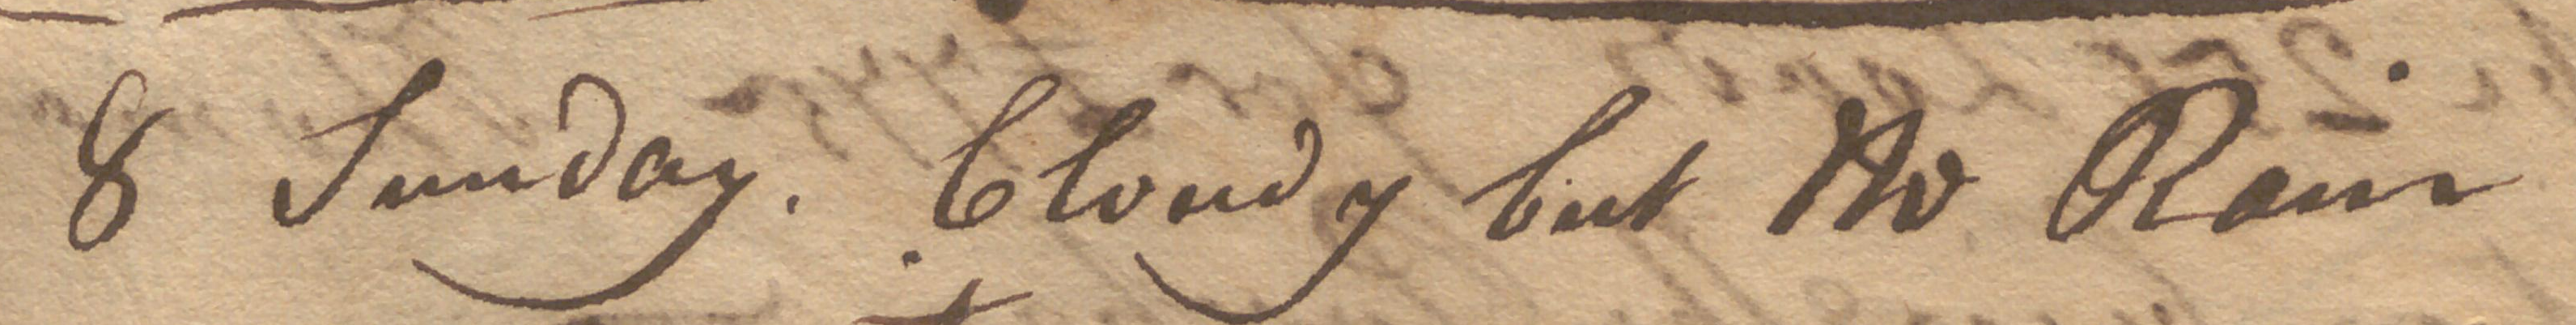8 Sunday. Cloudy but no Rain
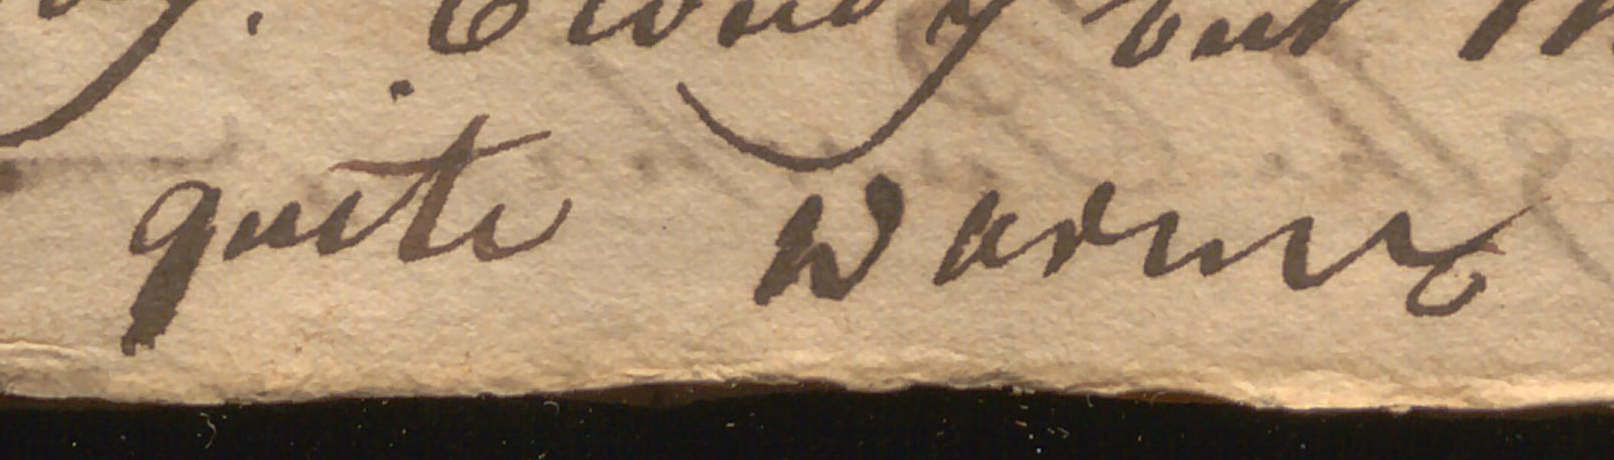quite warme
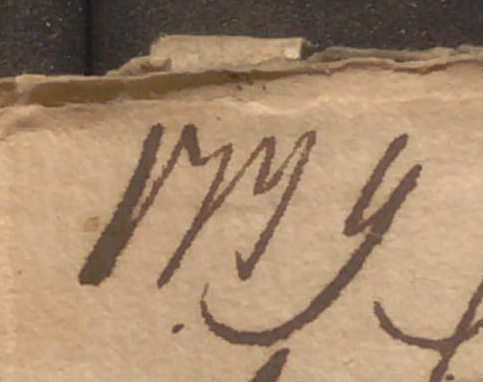1779
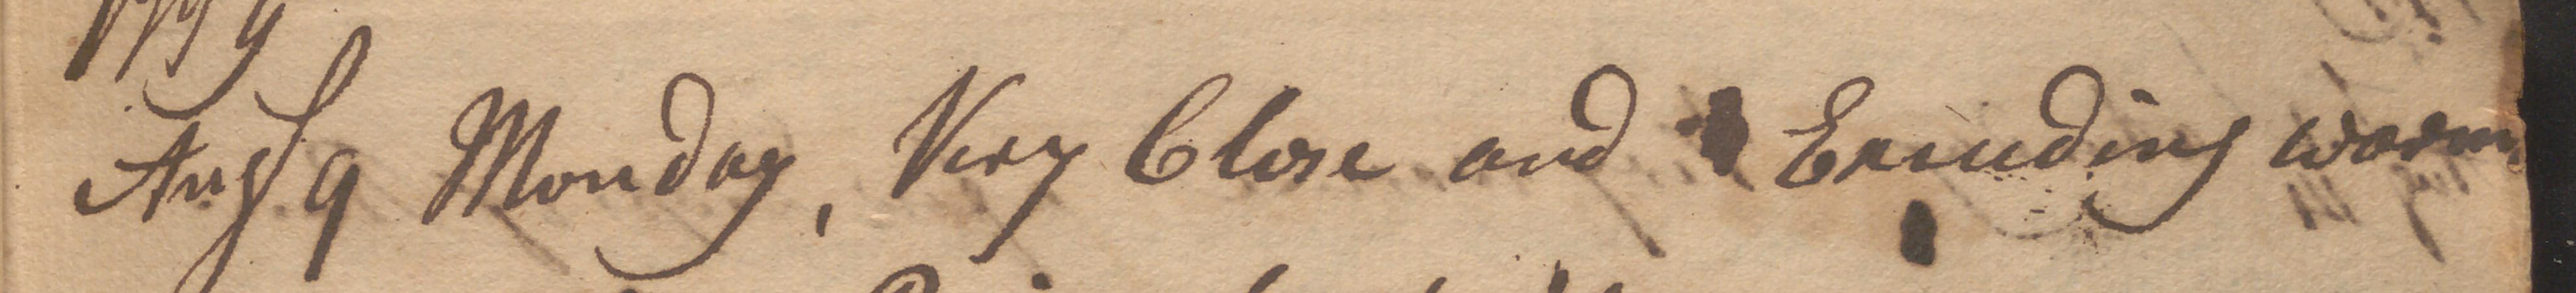Aug^t 9 Monday, Very Close and 3 Exceeding warm
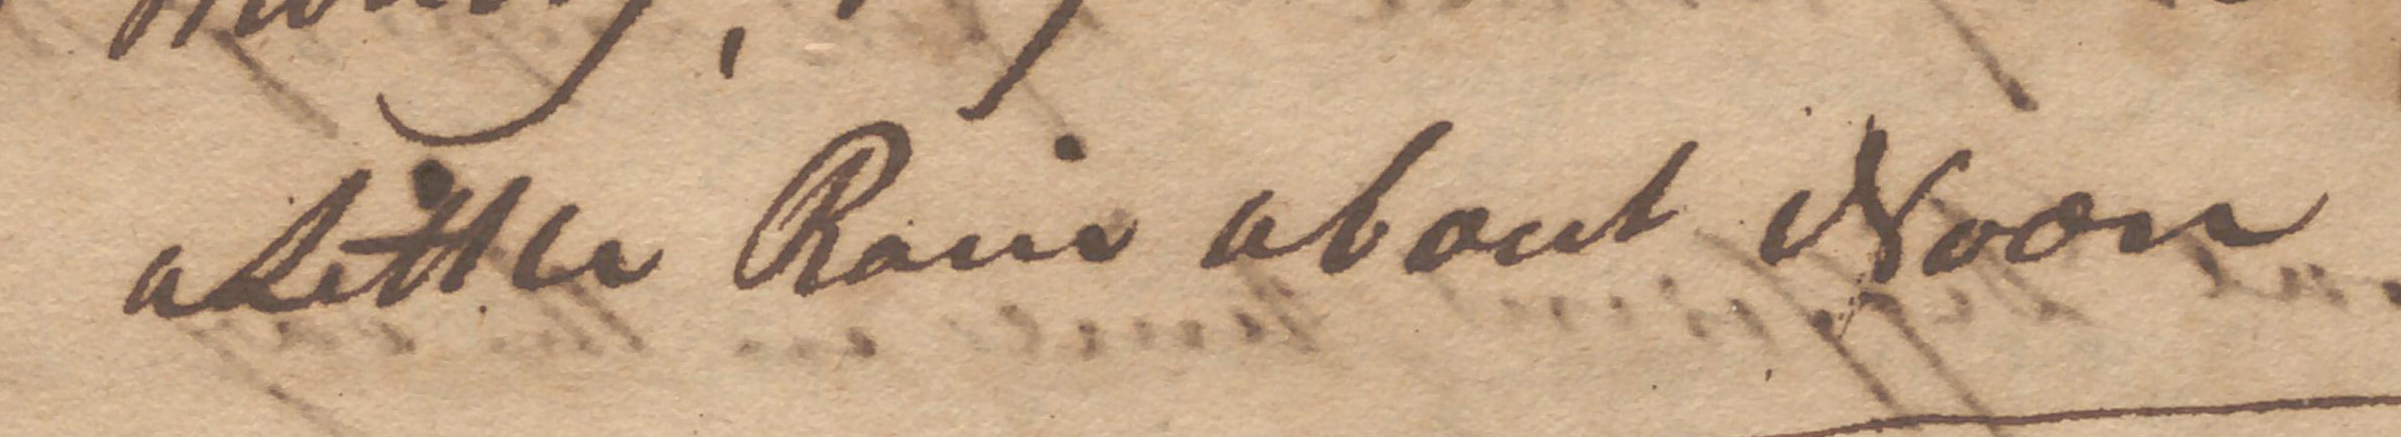a Little Rain about Noon
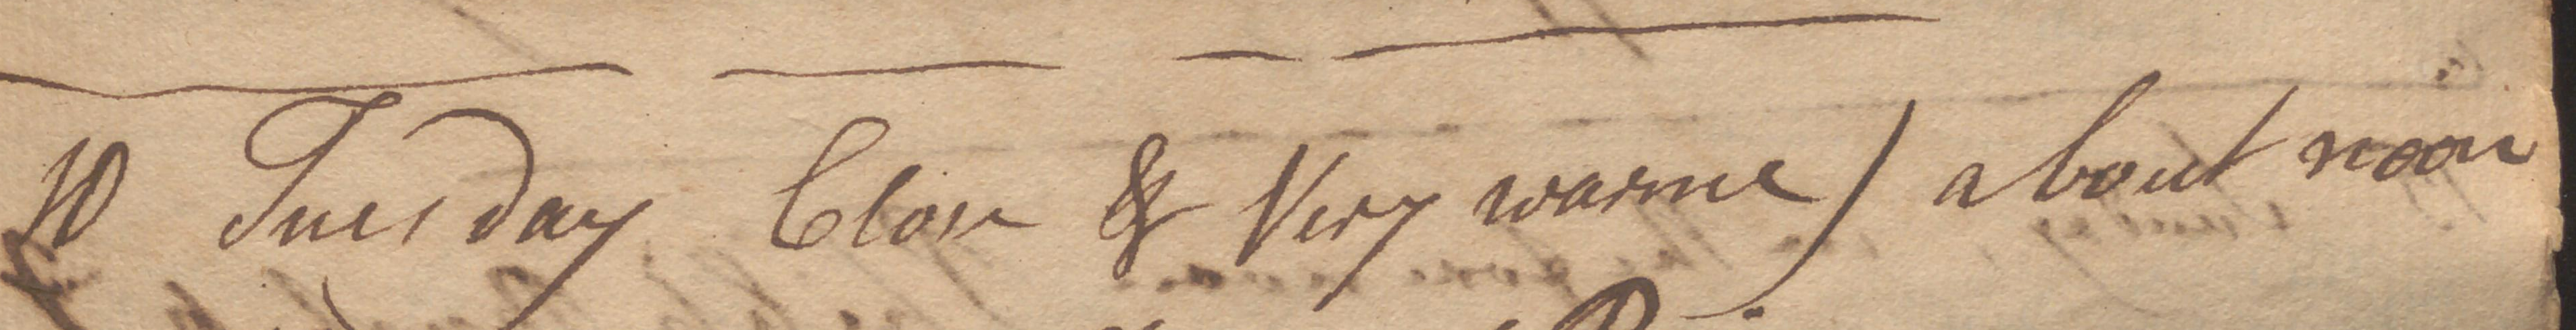10 Tuesday Close & Very warme) about noon
